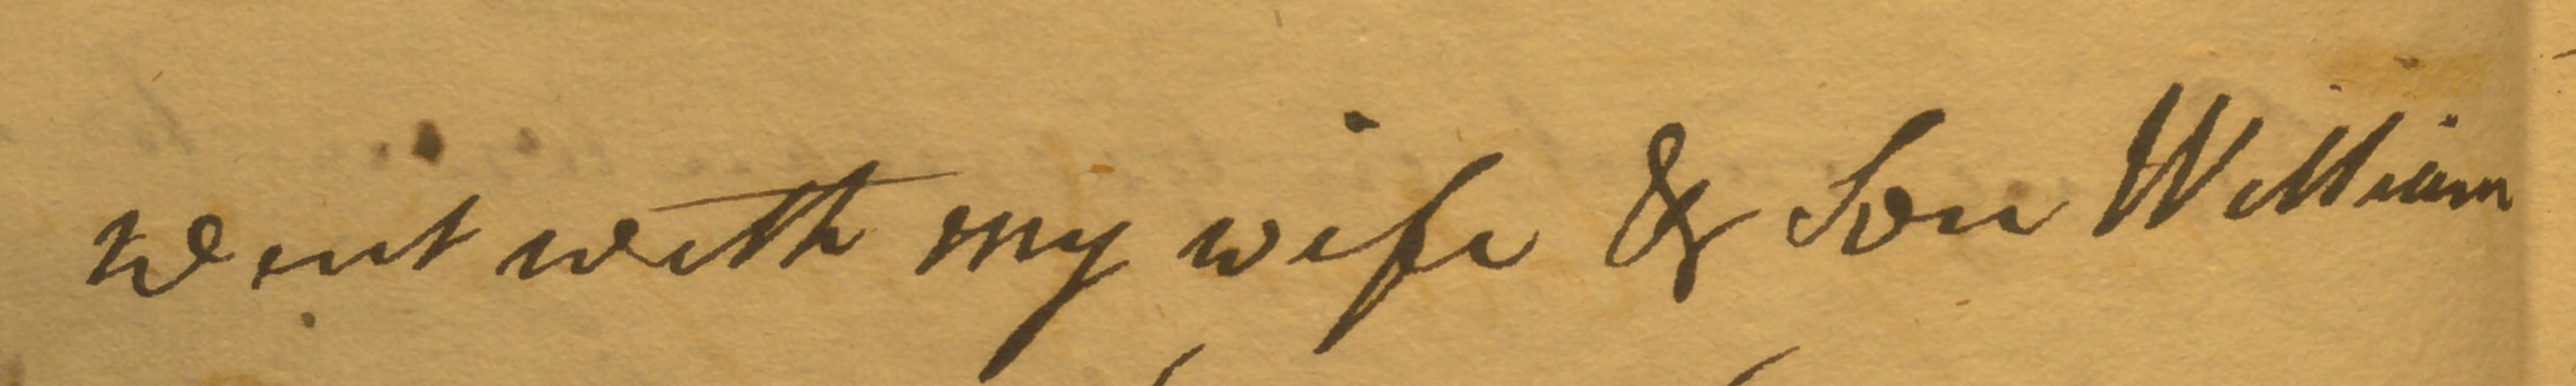went with my wife & son William
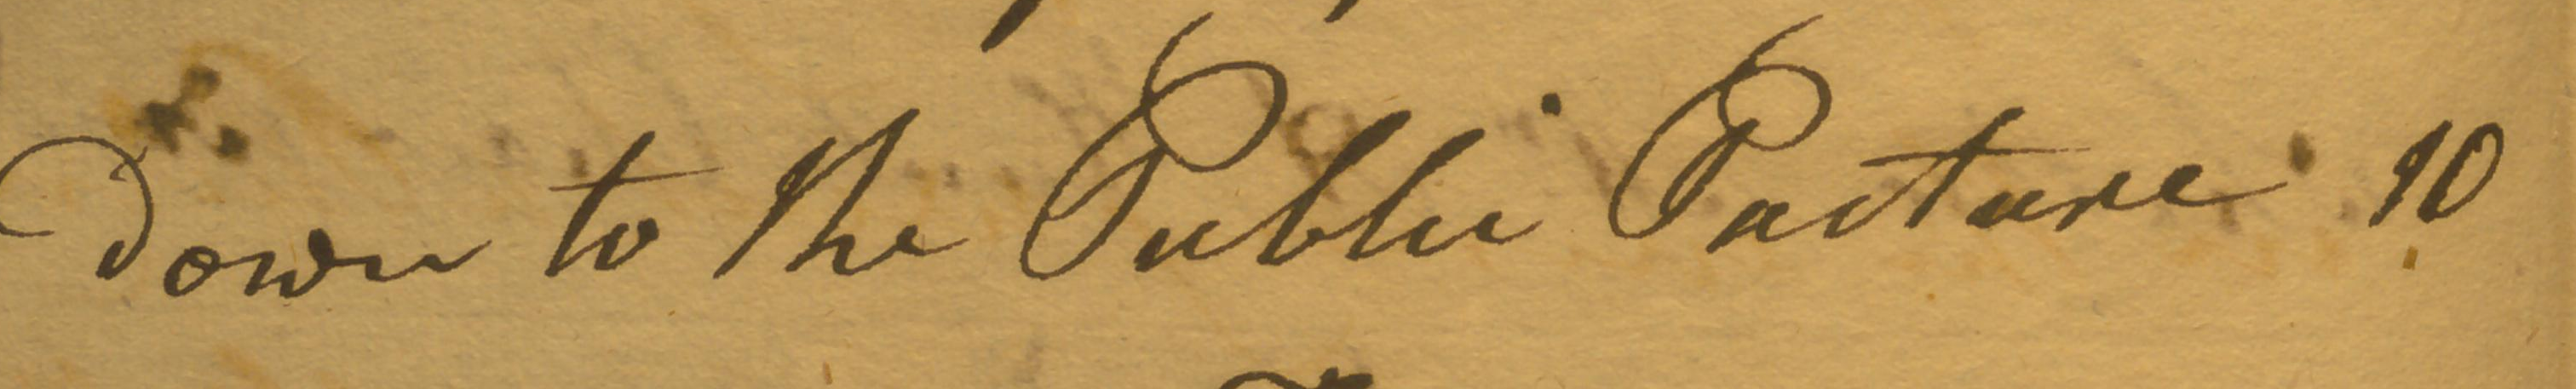down to the Public Pasture 10
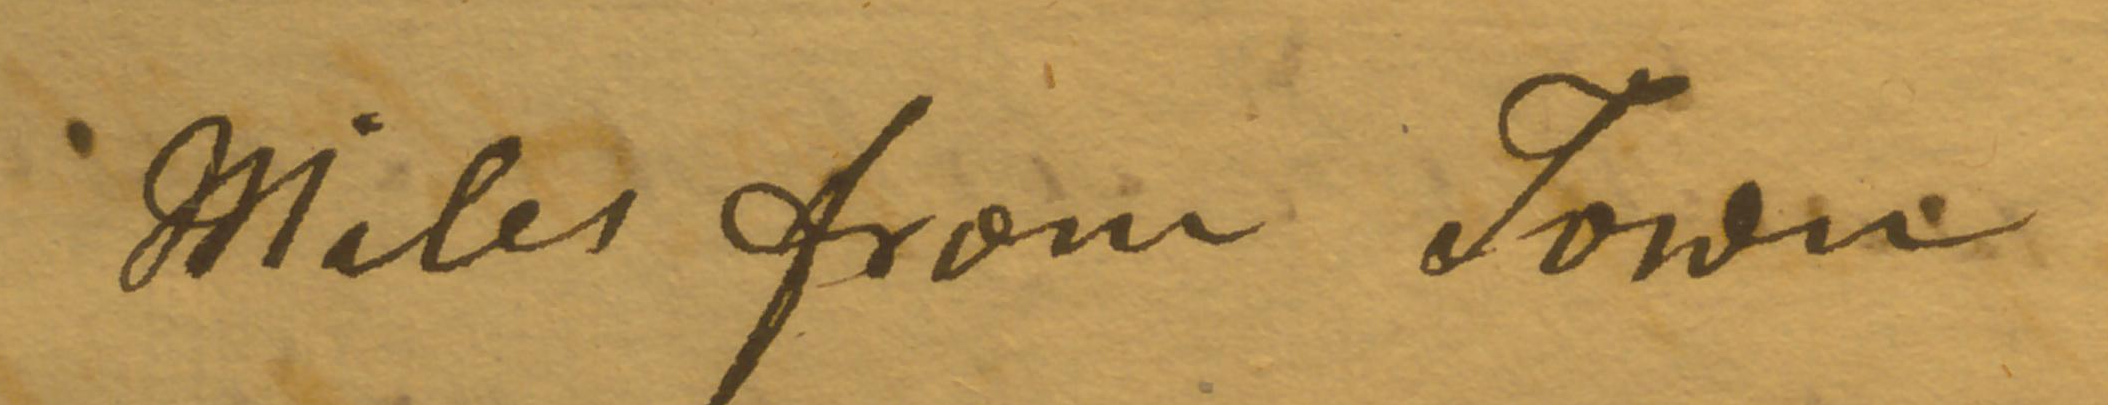Miles from Town
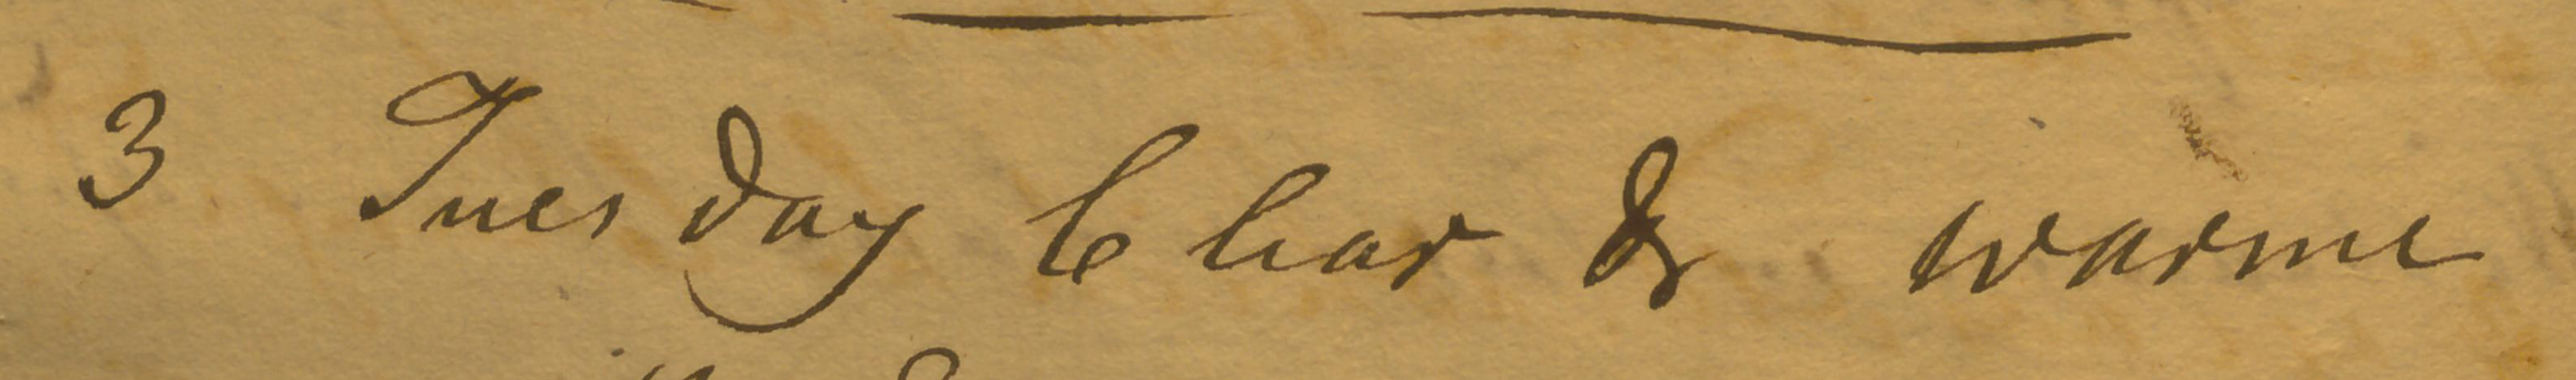3 Tuesday Clear & warme
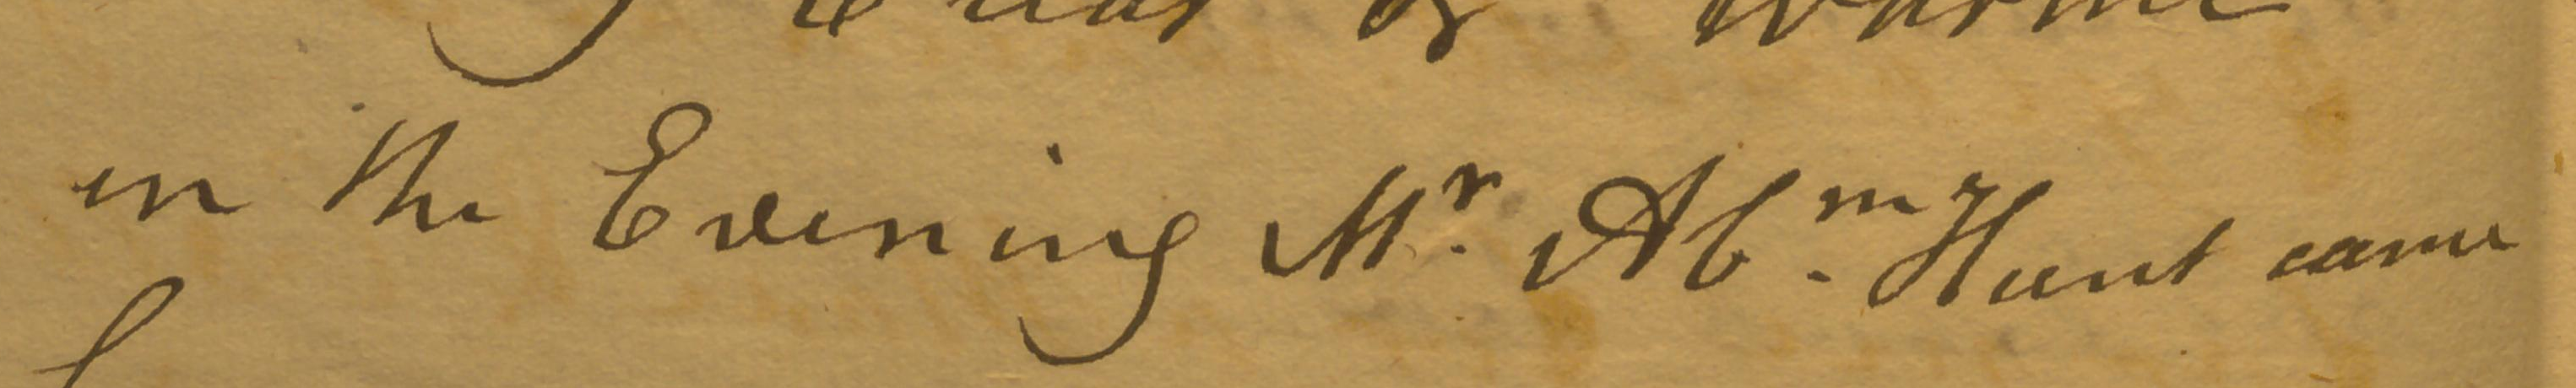in the Evening M^r. Ab^m. Hunt came
